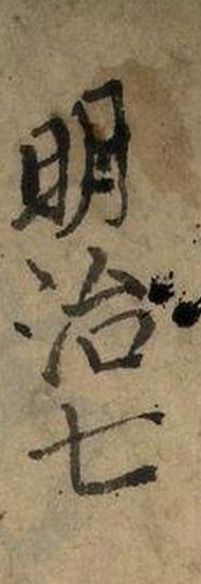明治七
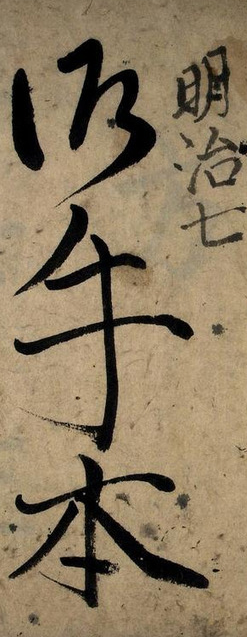御手本

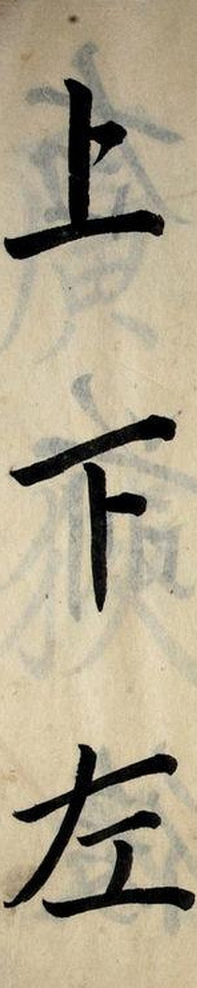上下左

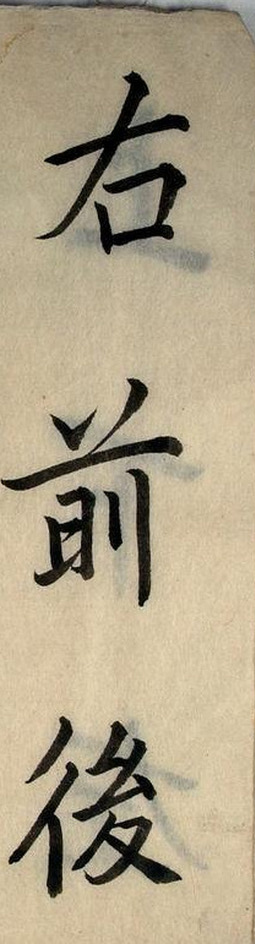右前後
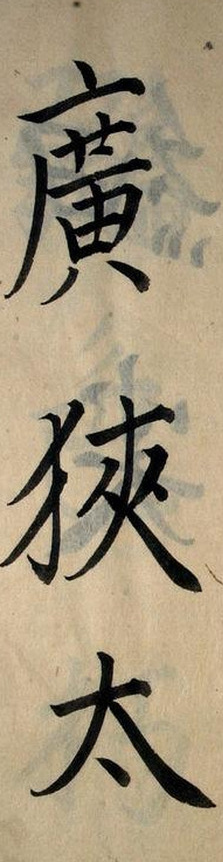廣狭太

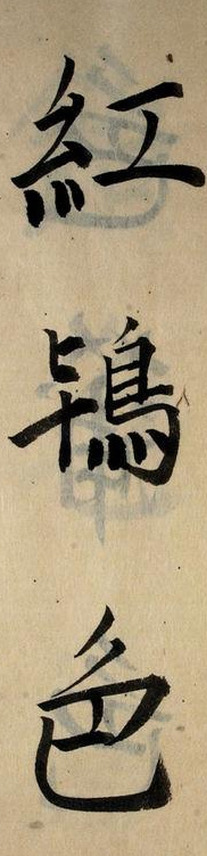紅鴇色
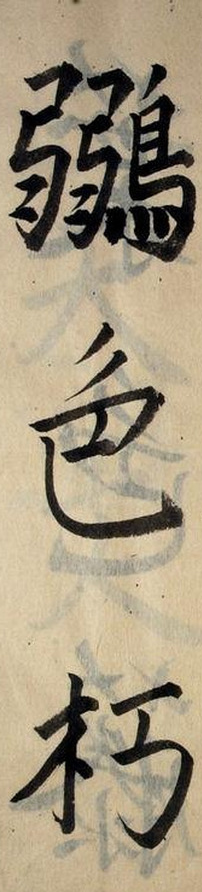鶸色朽

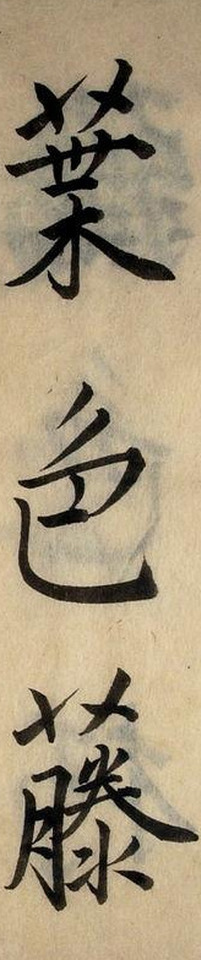葉色藤
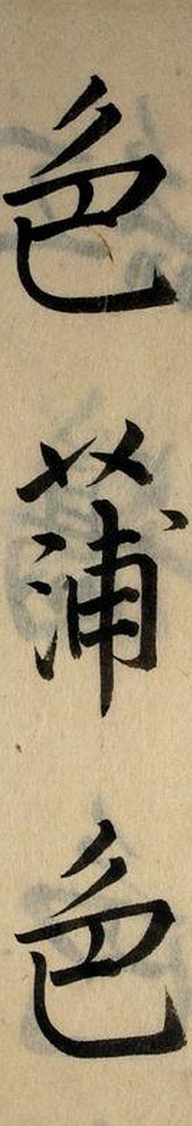色蒲色

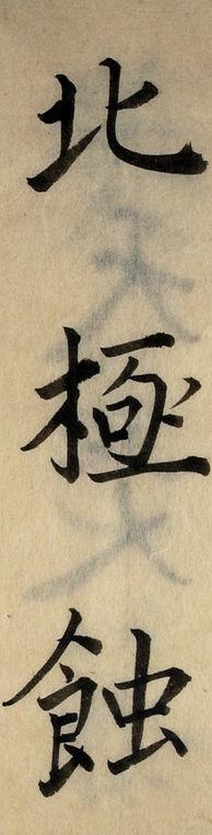北極蝕
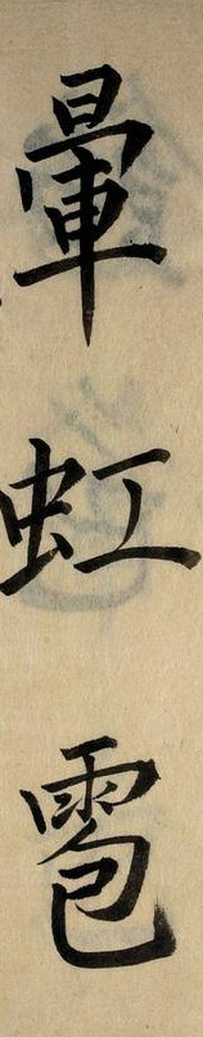暈虹雹
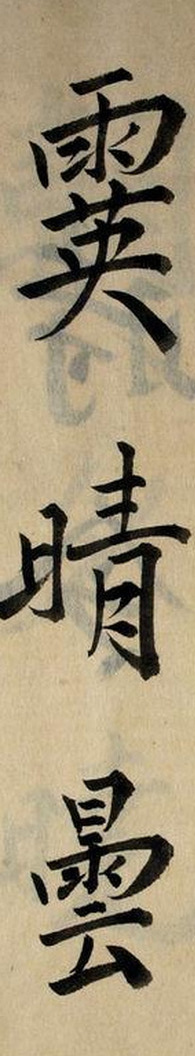霙晴曇
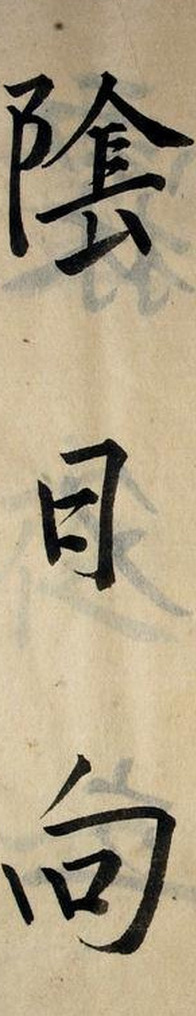陰日向

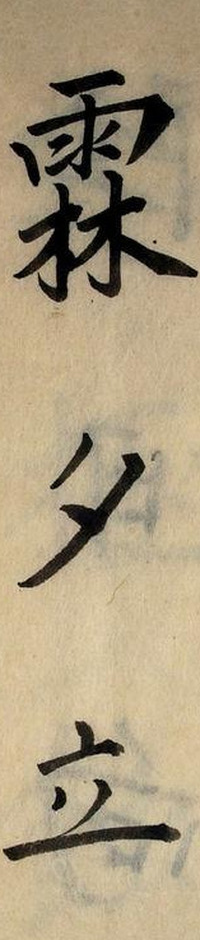霖夕立
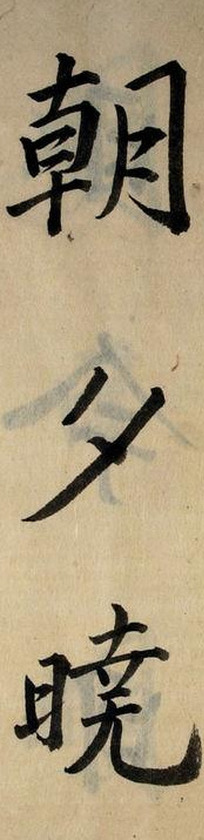朝夕暁
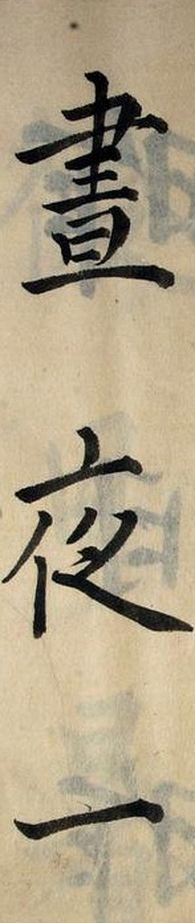晝夜一
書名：御手本（手習）
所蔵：福井県文書館 Fukui Prefectural Archives
